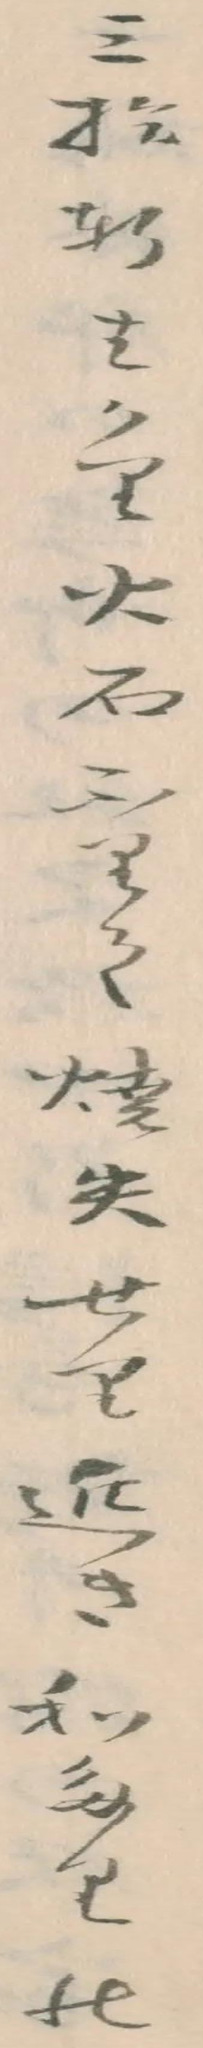三拾軒はかり火石ふりて焼失せり近きわたりの
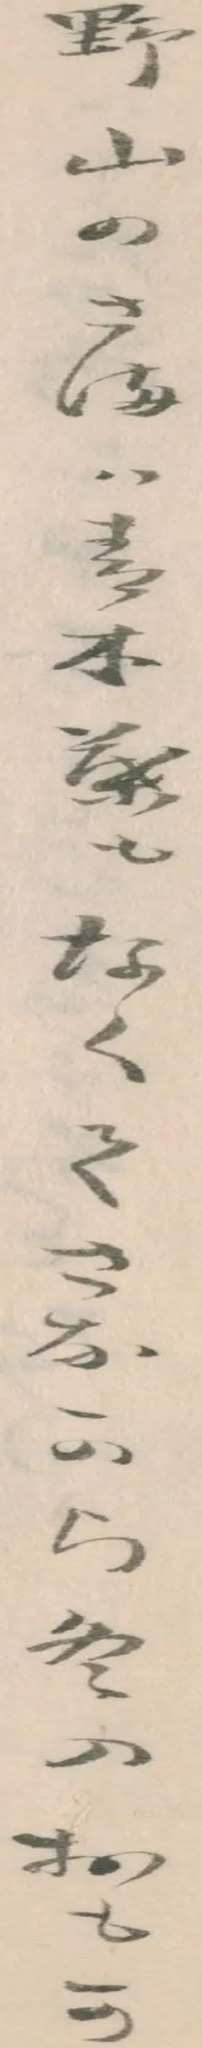野山のさまは青き葉もなくてさなから冬のおもか
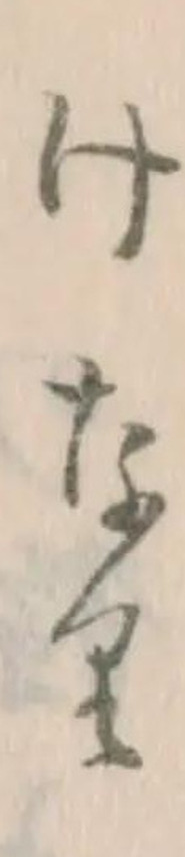けなり
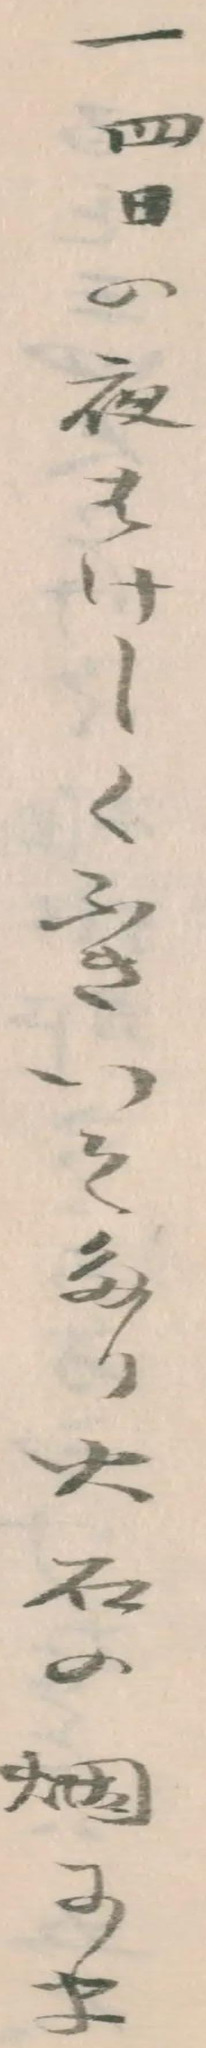一四日の夜はけしくふきいてたり火石の烟にま
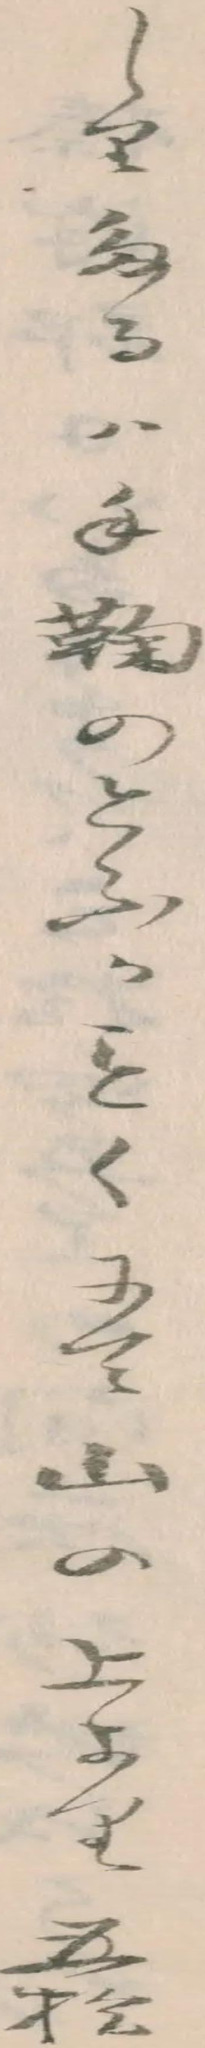しりたるは手鞠のとふかことくにて山の上より五拾
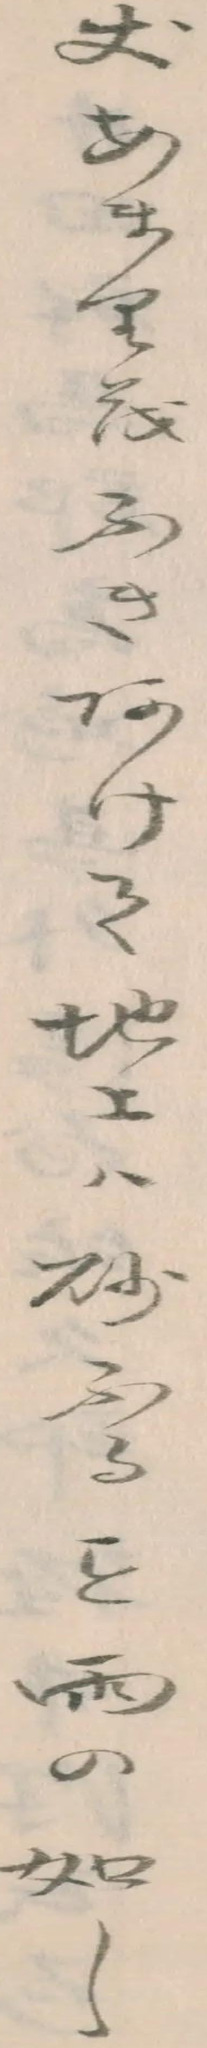丈あまりもふきあけて地上は砂ふること雨の如し
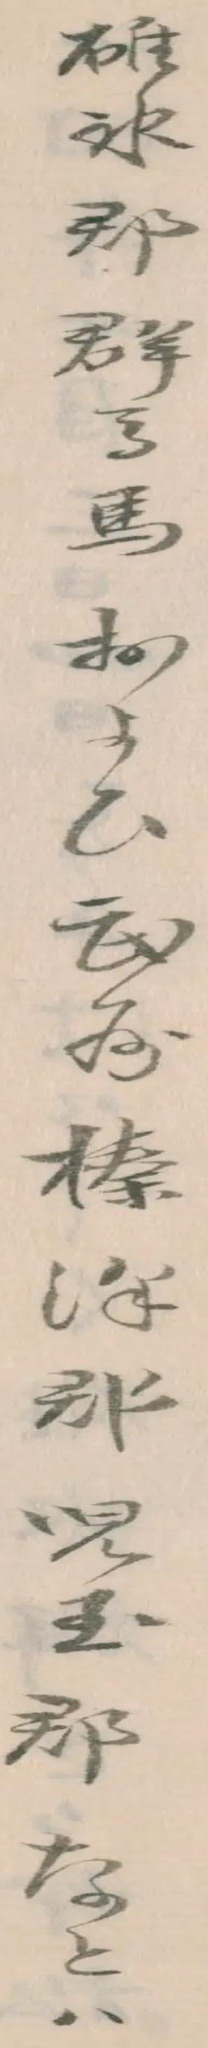碓氷郡群馬馬およひ武州榛沢郡児玉郡なとは
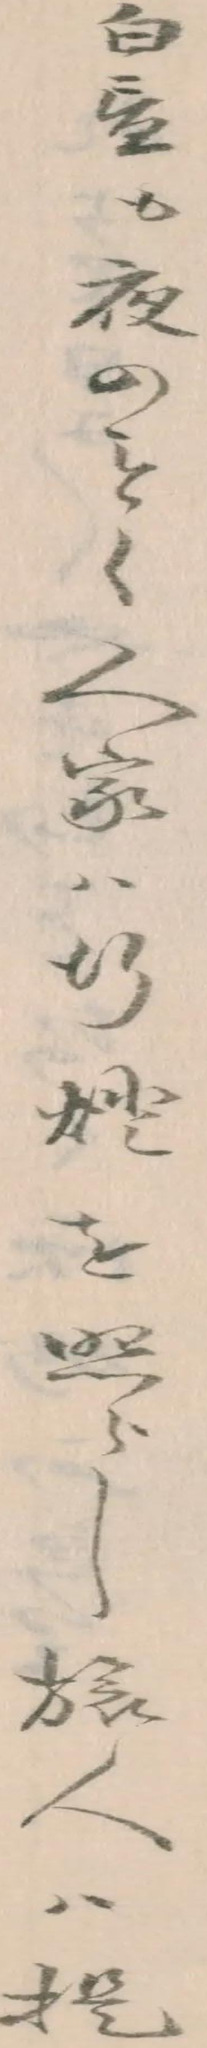白昼も夜のことく人家は行燈を照らし旅人は提
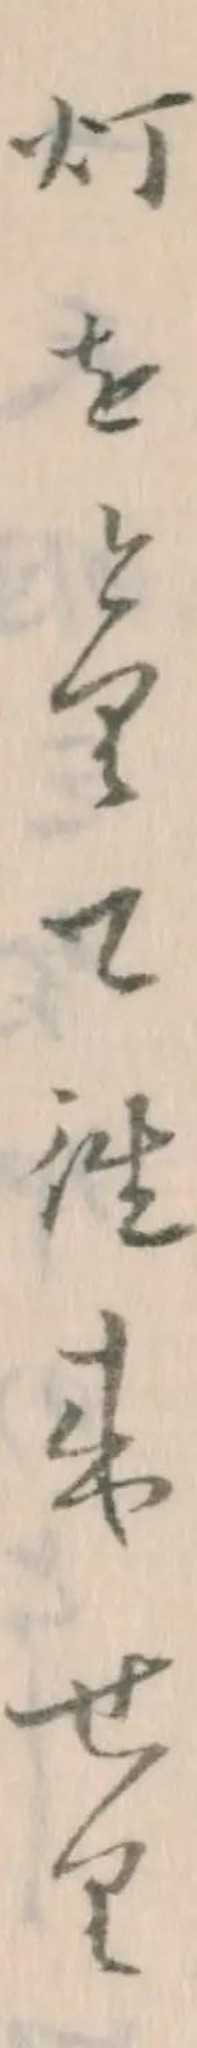灯をとりて往来せり
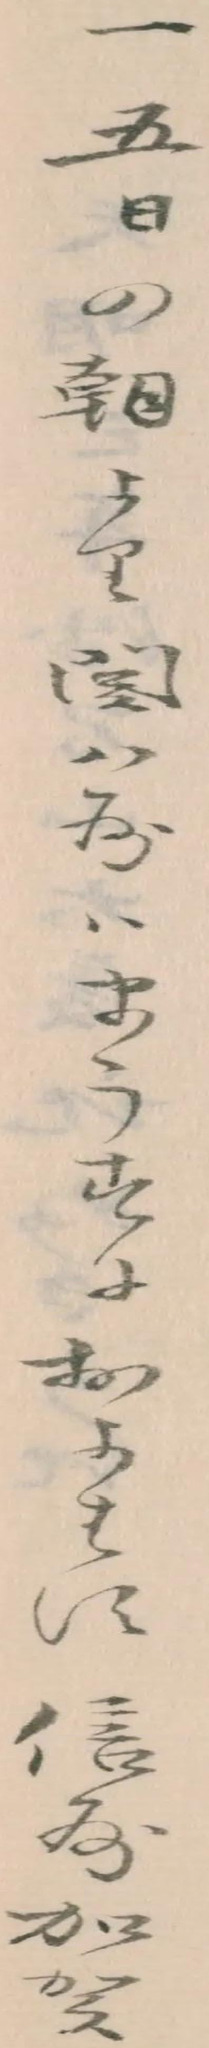一五日の朝より関八州はまうすにおよはす信州加賀
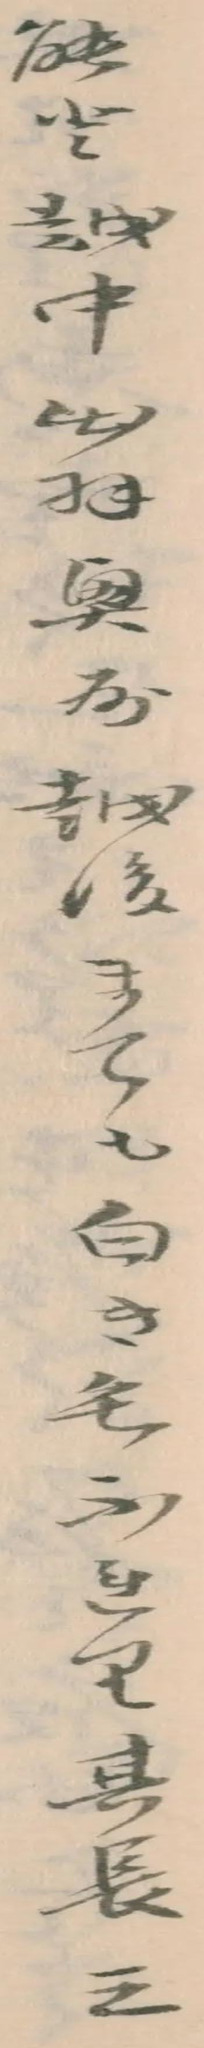能登越中出羽奥州越後まても白き毛ふれり其長三
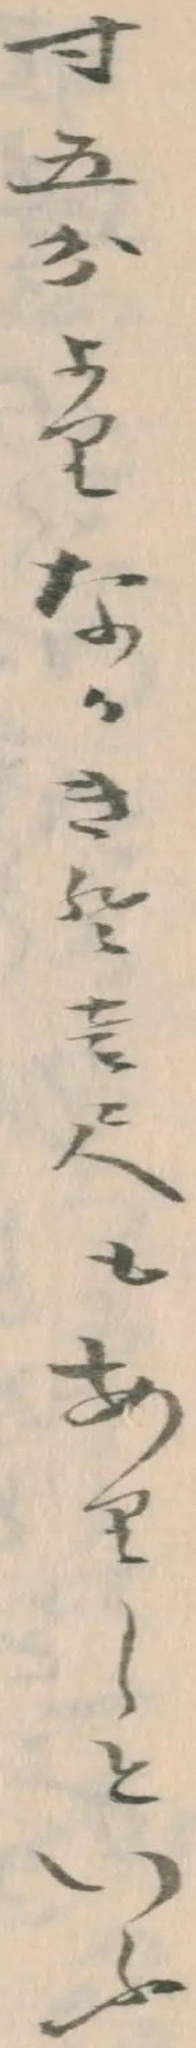寸五分よりなかきと壱尺もありしといふ
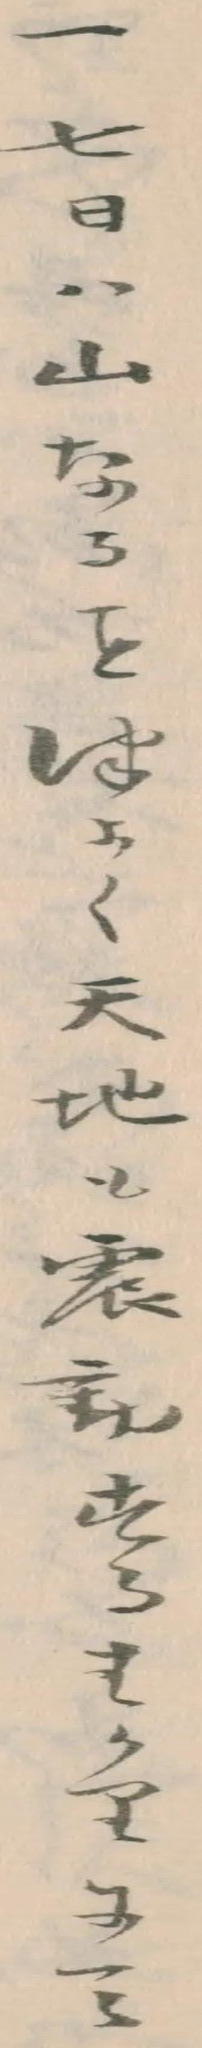一七日は山なることつよく天地も振動するはかりにて
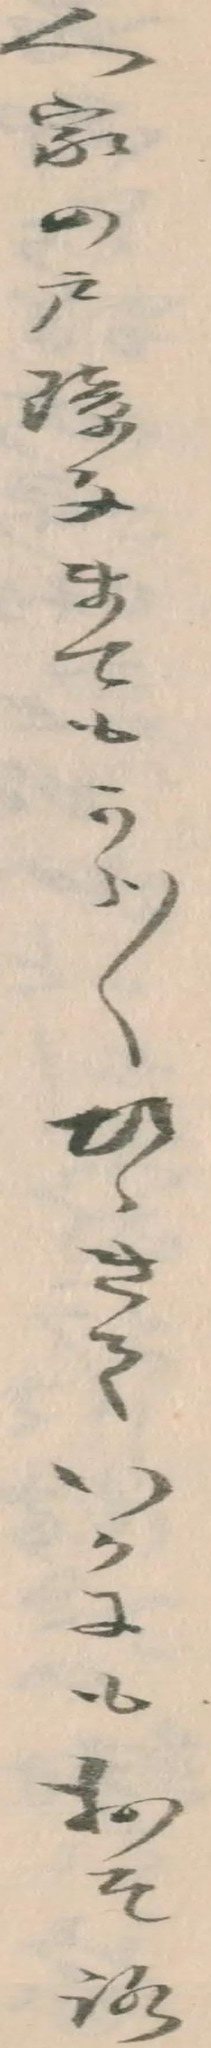人家の戸障子まてもから〳〵ひゝきていかにもおそろ
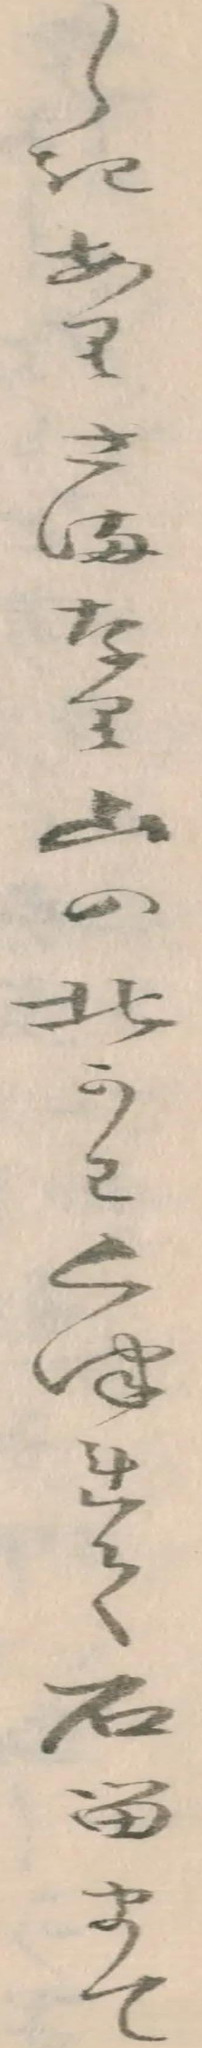しきありさまなり山の北かわくつれて石留まて
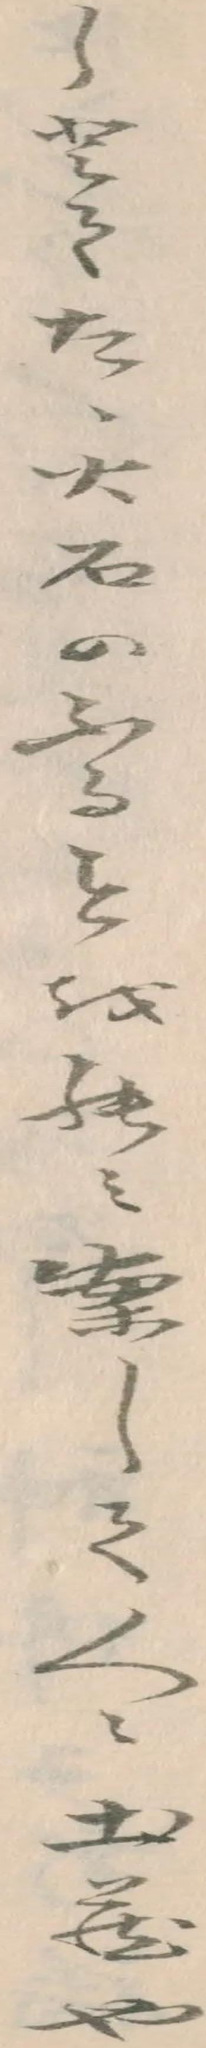しとてたゝ火石のふることをのみ案して人々土蔵や
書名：地災撮要. 巻11-12(地震之部)
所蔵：国立国会図書館 National Diet Library, JAPAN
